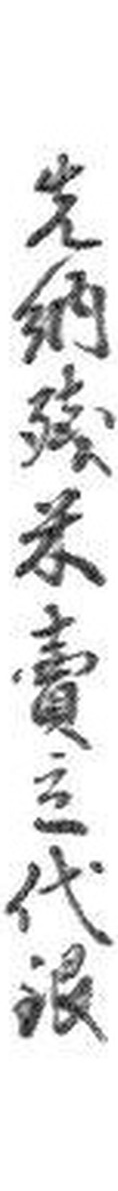先納残米売立代銀
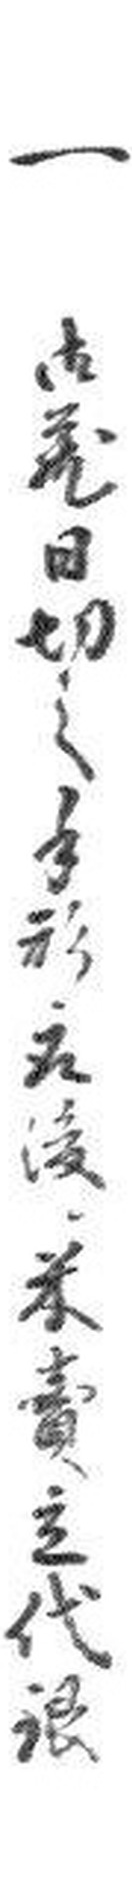一御蔵日切之手形取後レ米売立代銀
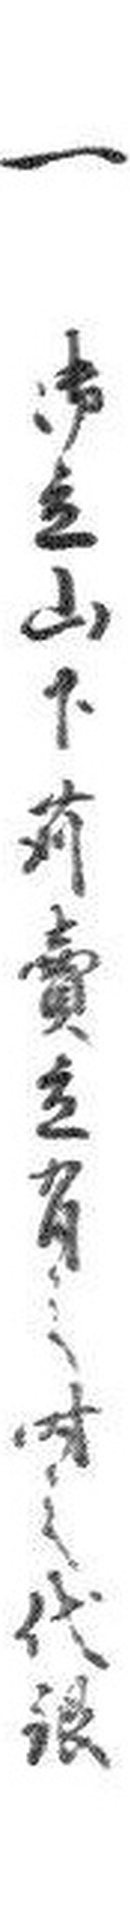一御立山下刈売立有之之代銀
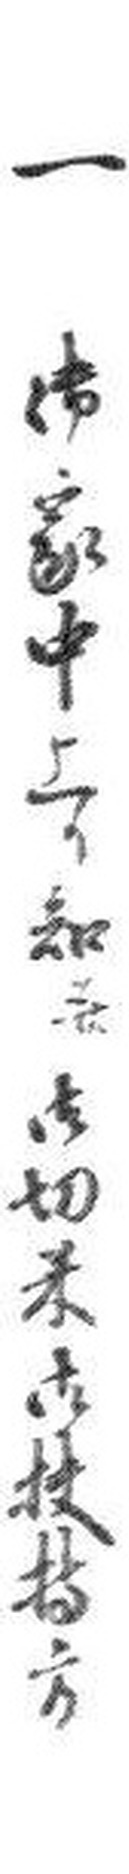一御家中上り知并御切米御扶持方
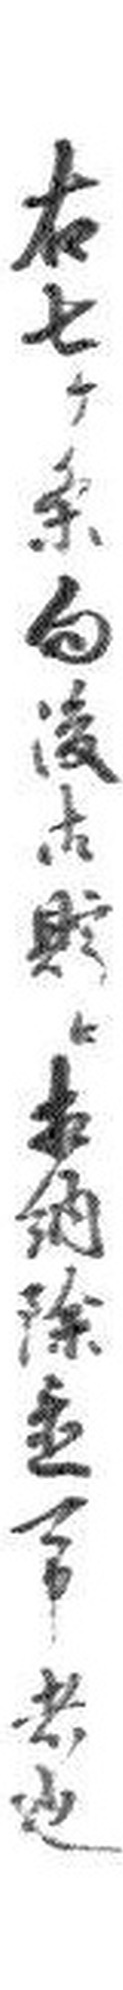右七ヶ条向後御貯江相納除置可申者也
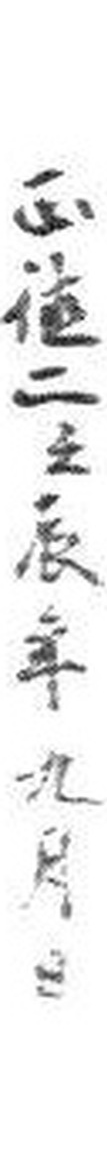正徳二壬辰年九月日
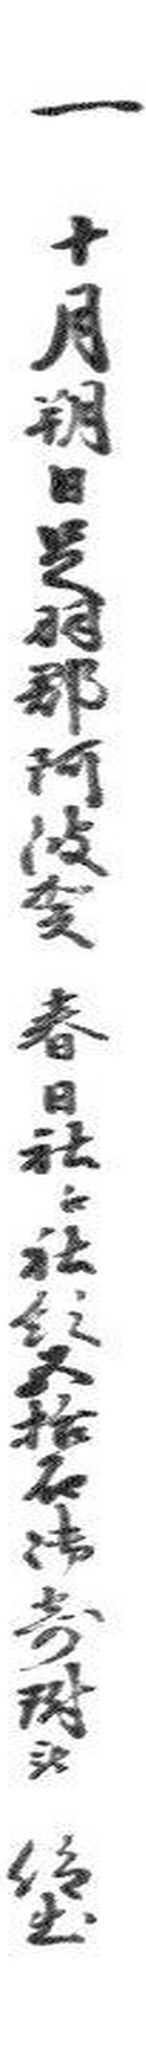一十月朔日足羽郡阿波賀春日社え社領五拾石御寄附被仰出
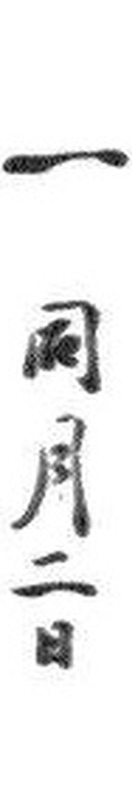一同月二日

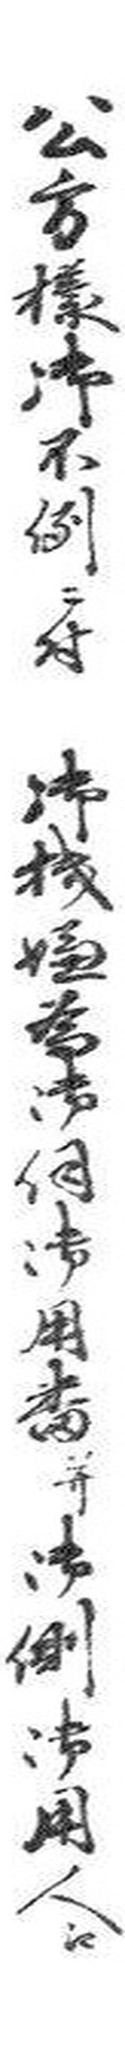公方様御不例ニ付御機嫌為御伺御用番并御側御用人江
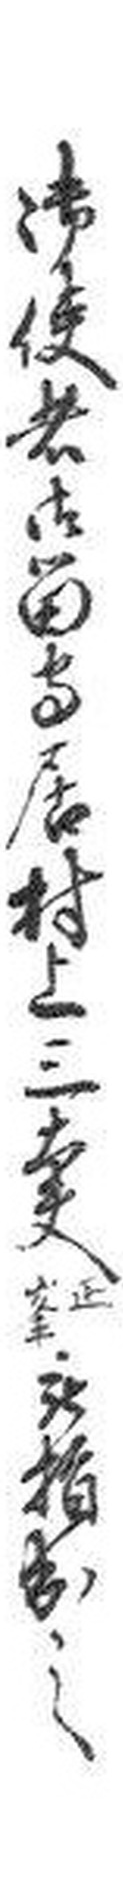御使者御留守居村上三太夫正峯被指上之
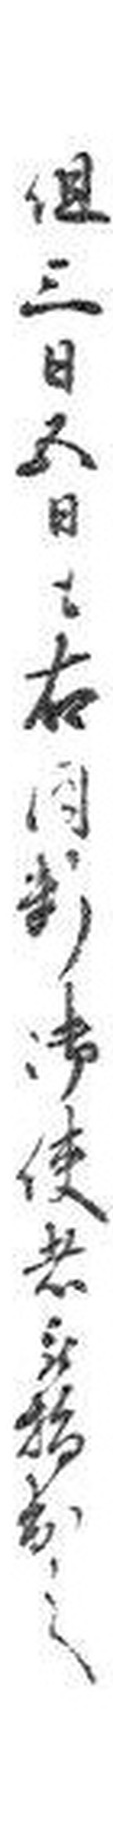但三月五日も右同断御使者被指上之
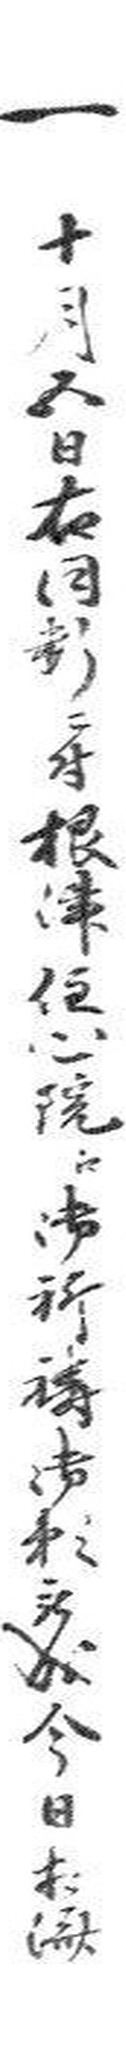一十月五日右同断ニ付根津住心院江御祈祷御頼被成今日相済
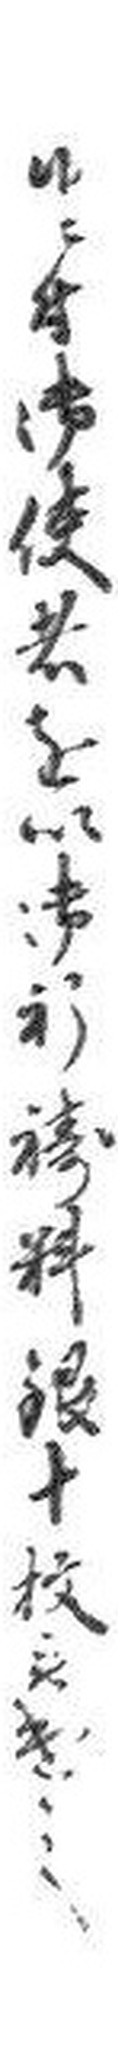候ニ付御使者を以御祈禱料銀十枚被遣之
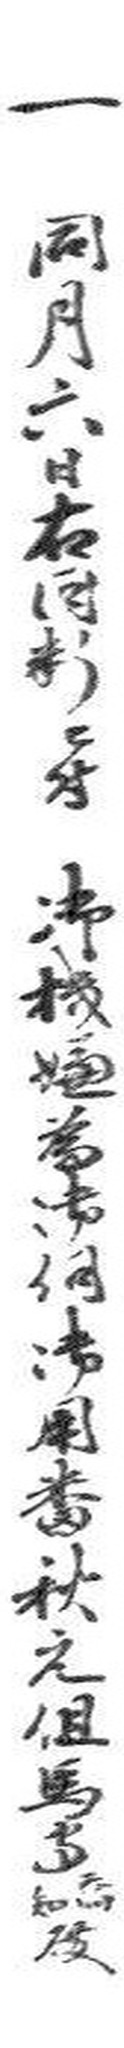一同月六日右同断ニ付御機嫌為御伺御用番秋元但馬守喬知殿
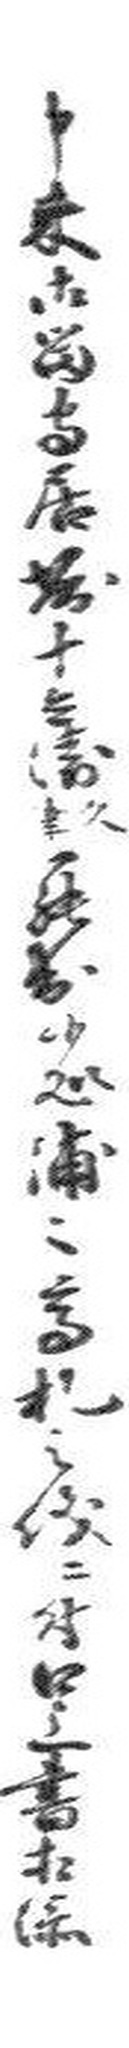申来御留守居堀十兵衛久律罷出候処浦々高札之儀ニ付口上書相添
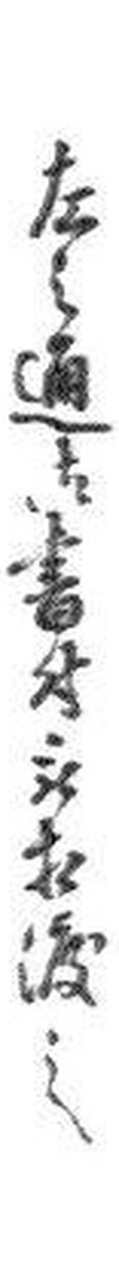左之通御書付被相渡之
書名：家譜 二十九 吉邦公 従正徳二年到正徳三年
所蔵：福井県文書館 Fukui Prefectural Archives
